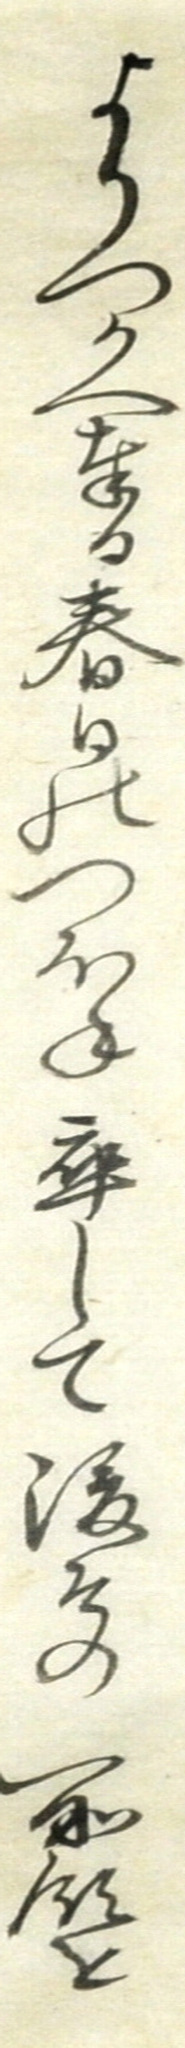よりつかへ奉る春日のつほね卒して後その所領を
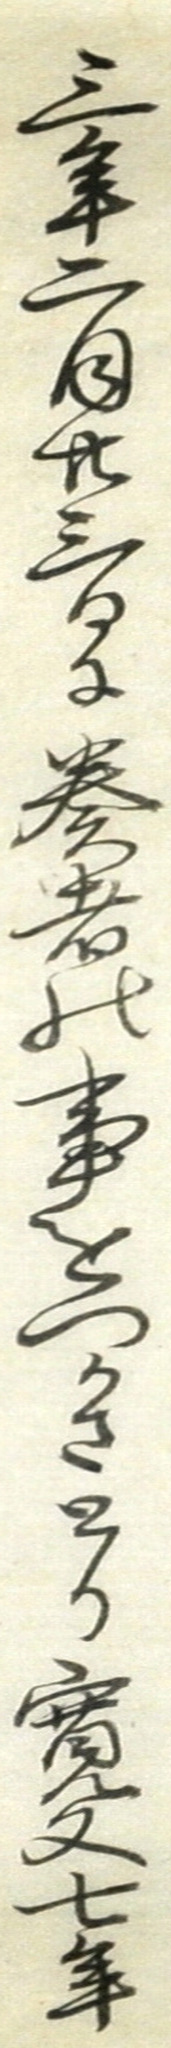三年二月廿三日に奏者の事をつかさとり寛文七年
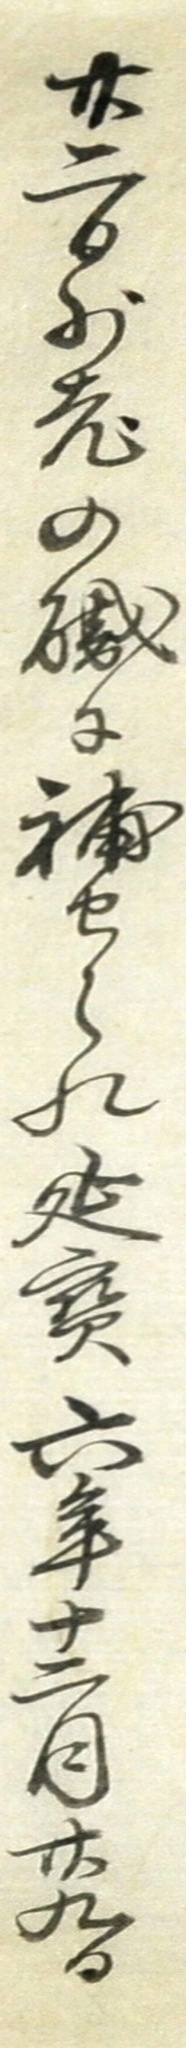廿二日少老の職に補せられ延宝六年十二月廿九日

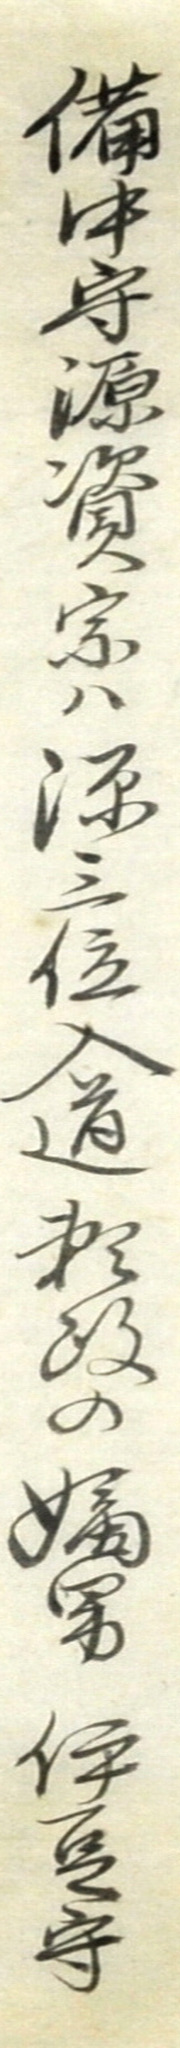備中守源資宗は源三位入道頼政の嫡男伊豆守
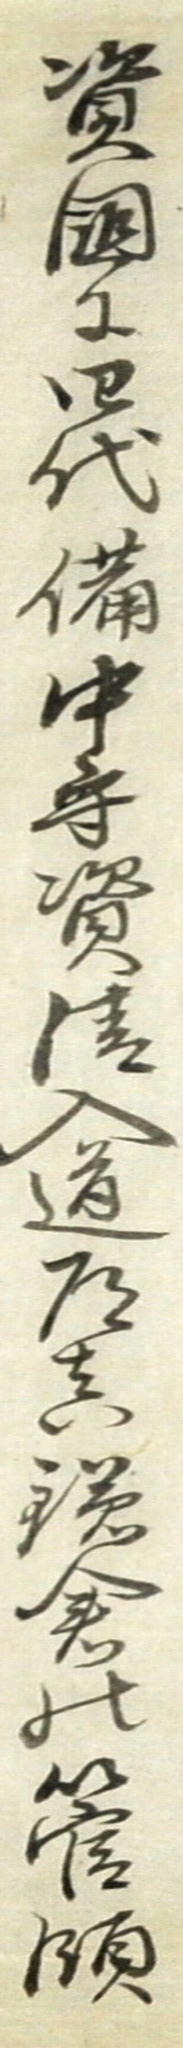資国に四代備中守資清入道道真鎌倉の管領
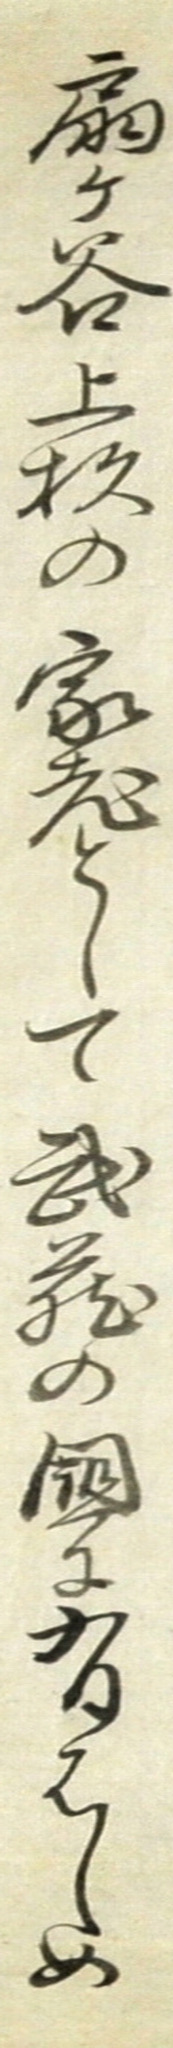扇ヶ谷上杉の家老として武蔵の国に有はしめ

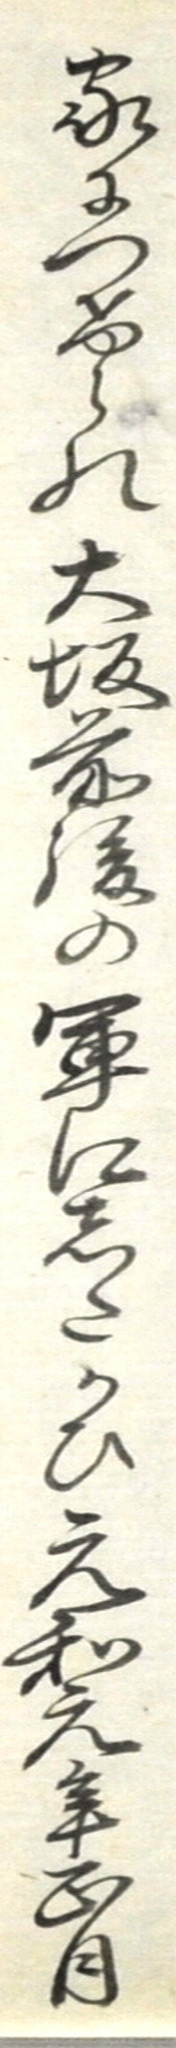家につけられ大坂前後の軍にしたかひ元和元年正月
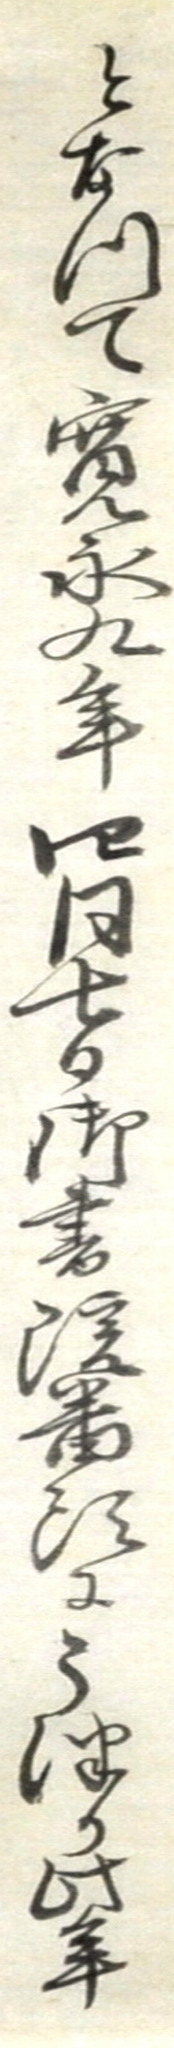となつて寛永九年四月七日御書院番頭にうつり此年
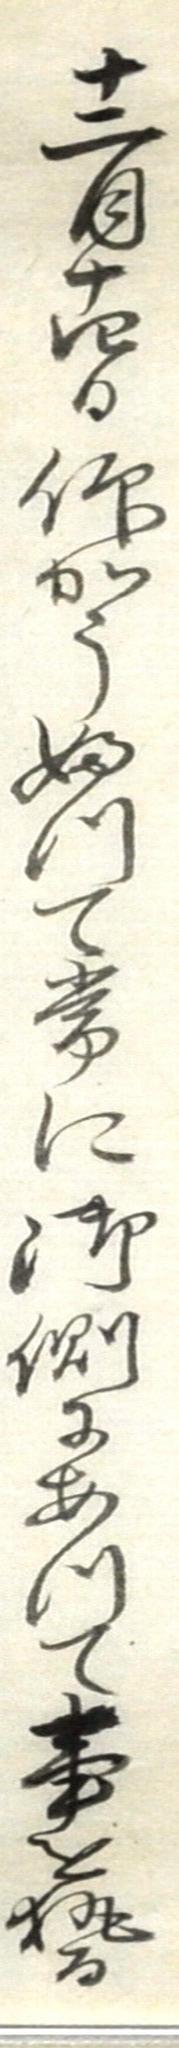十二月十四日仰かうふつて常に御側にあつて事を執る
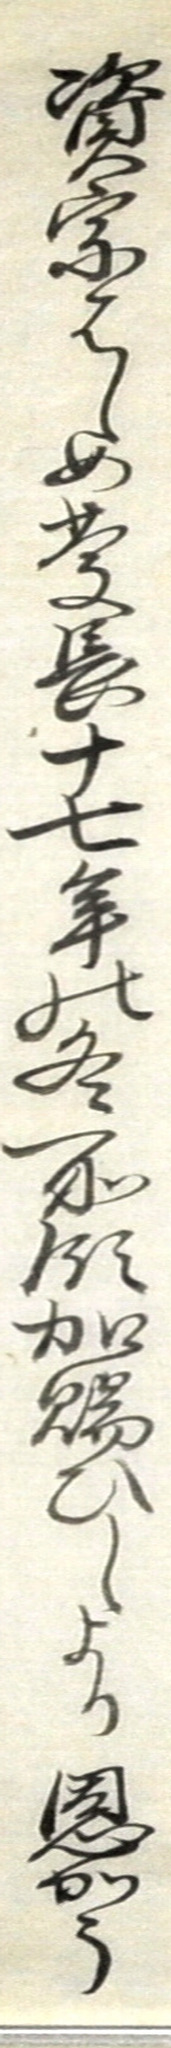資宗はしめ慶長十七年の冬所領加賜ひしより恩かう
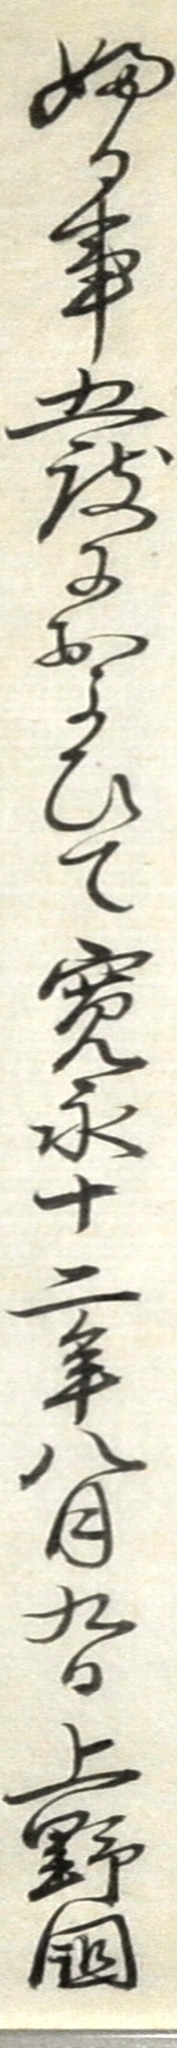ふる事五度におよひて寛永十二年八月九日上野国
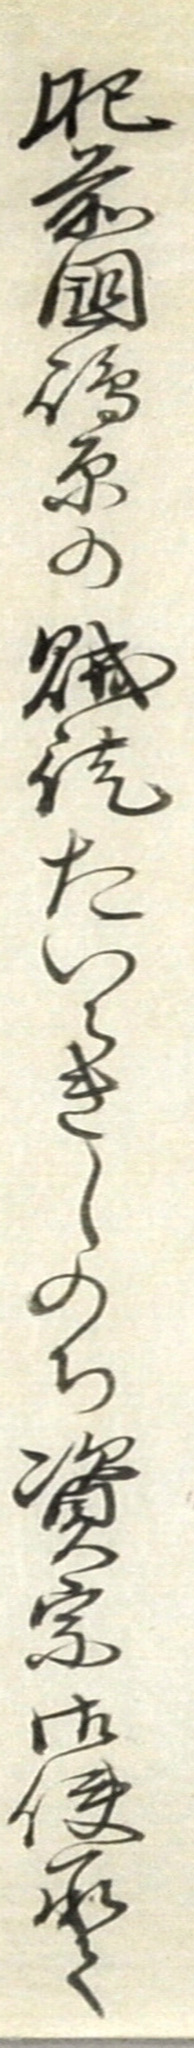肥前国島原の賊徒たいらきしのち資宗御使承て
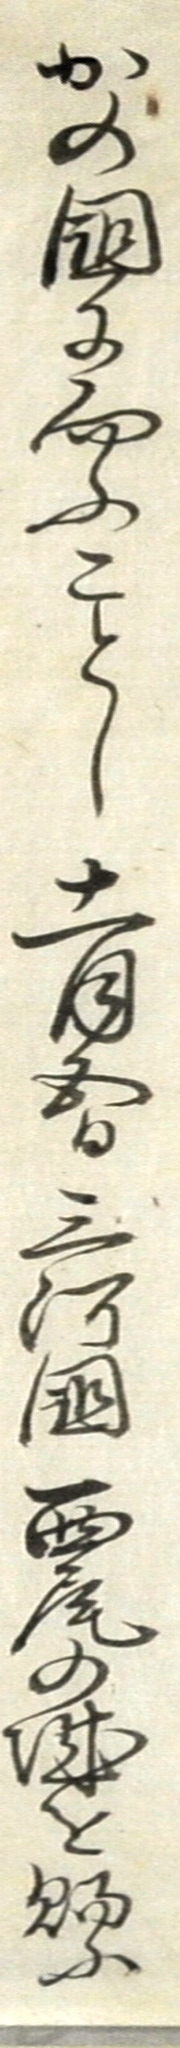かの国に向ふことし十一月五日三河国西尾の城を賜ふ

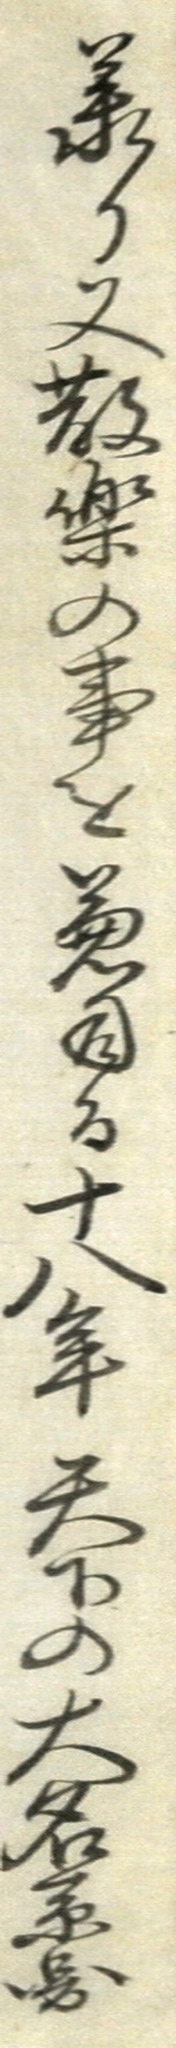承り又散楽の事を兼司る十八年天下の大名系図
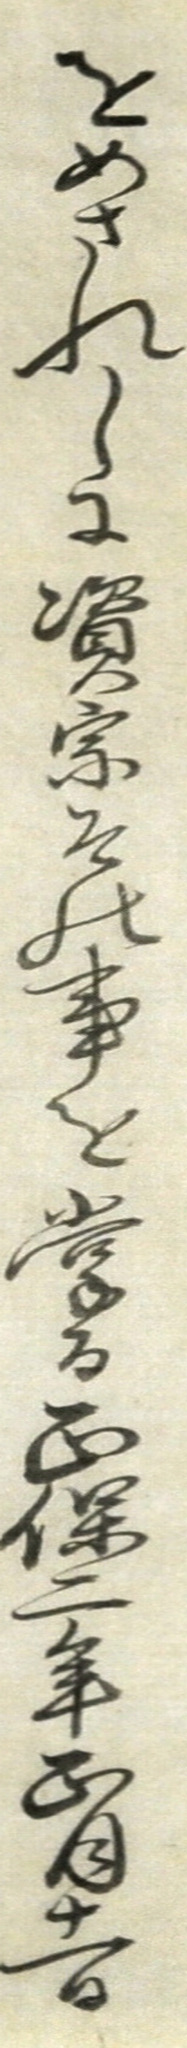をめされしに資宗その事を掌る正保二年正月十一日
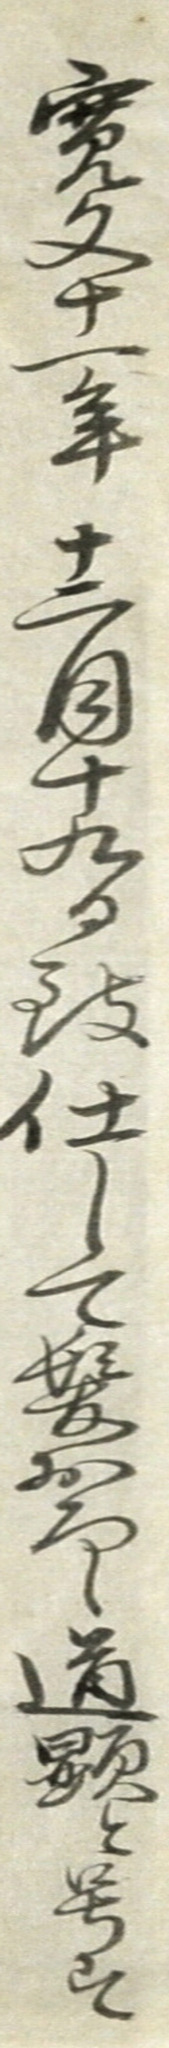寛文十一年十二月十九日致仕して髪おろし道顕と号す
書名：藩翰譜（六）
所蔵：伊那市立高遠町図書館・合同会社AMANE
